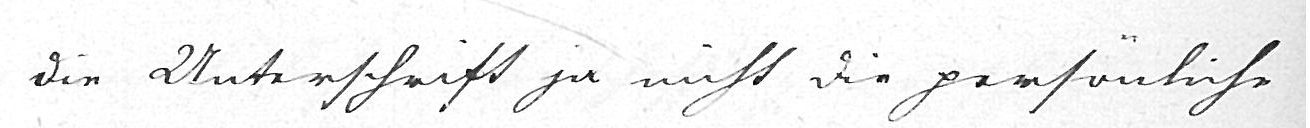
die Unterschrift ja nicht die persönliche
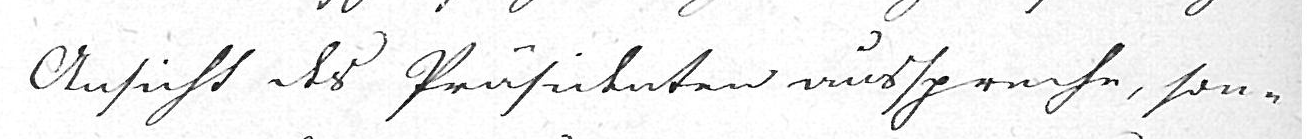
Ansicht des Präsidenten ausspreche, son-
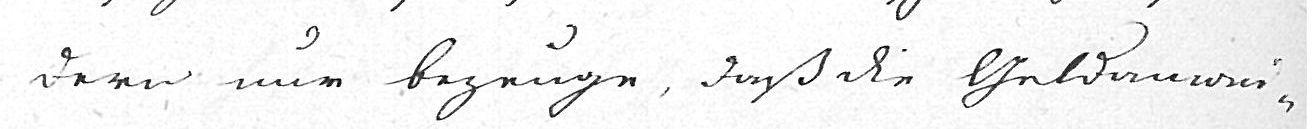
dern nur bezeuge, daß die Geldanwei-
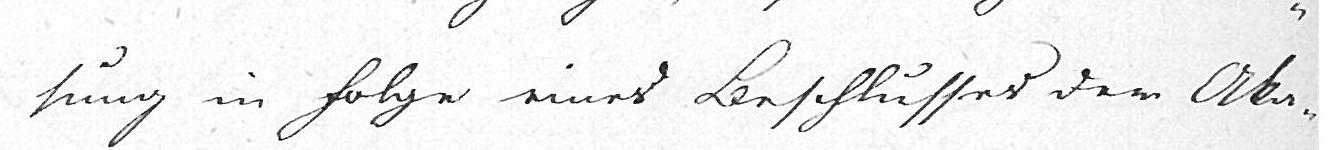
sung in Folge eines Beshclusses der Aka-
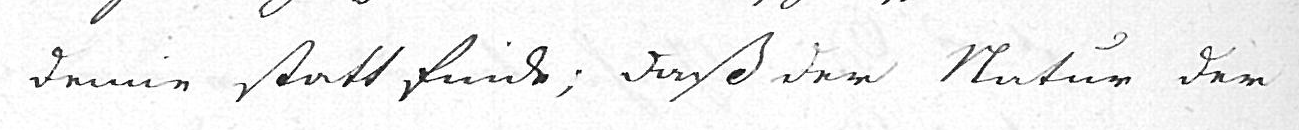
demie stattfinde; daß der Natur der
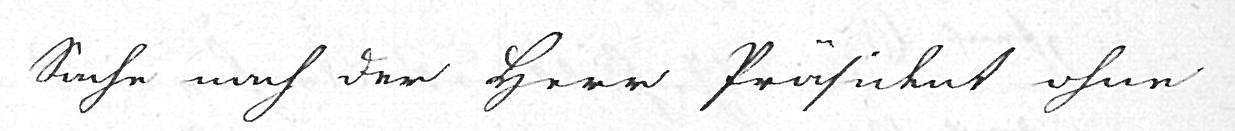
Sache nach der Herr Präsident ohne
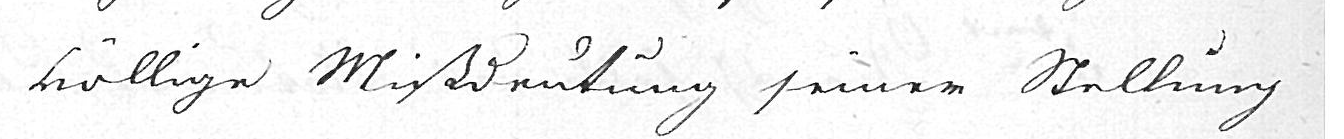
völlige Mißdeutung seiner Stellung
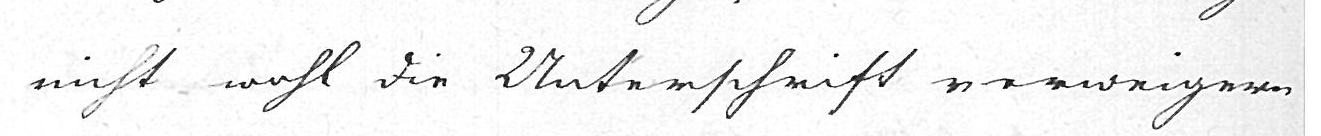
nicht wohl die Unterschrift verweigern
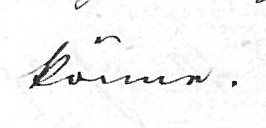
könne.
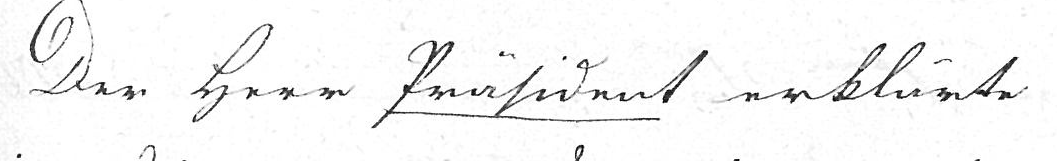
Der Herr Präsident erklärte
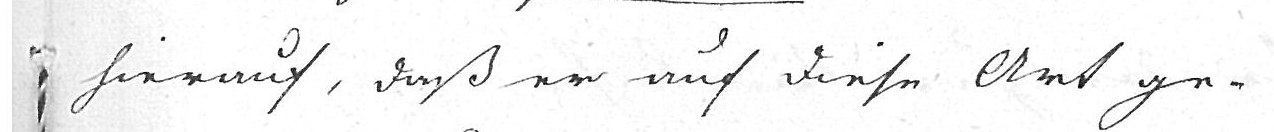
hierauf, daß er auf diese Art ge-
